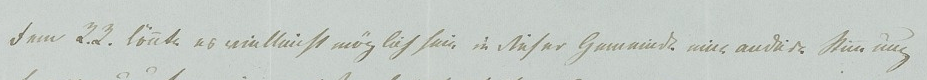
Dem R.R. könnte es vielleicht möglich sein in dieser Gemeinde eine andere Stimmung
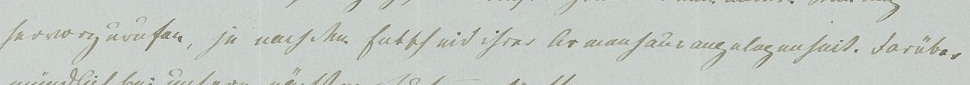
hervorzurufen, je nach dem Entscheid ihrer Armenhausangelegenheit. Darüber
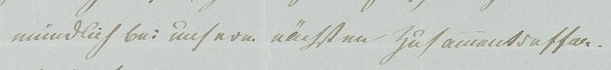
mündlich bei unserm nächsten Zusammentreffen.
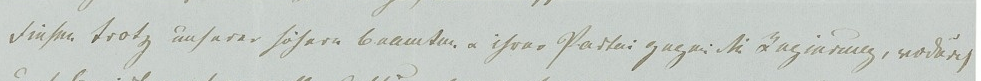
Diesen Trotz unserer höhern Beamten & ihrer Partei gegen die Regierung, wodurch
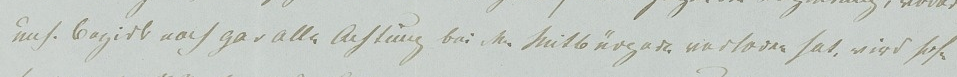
uns. Bezirk noch gar alle Achtung bei den Mitbürgern verloren hat, wird hof-
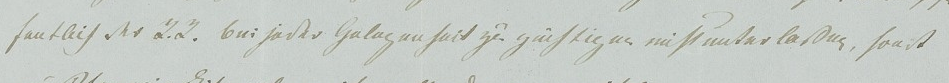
fentlich der R.R. bei jeder Gelegenheit zu züchtigen nicht unterlaßen, sonst
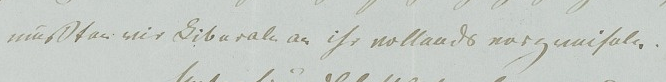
müßten wir Liberale an ihr vollends verzweifeln.
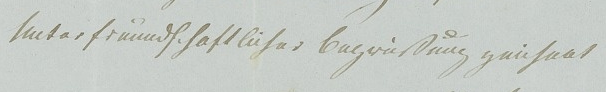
Unter freundschaftlicher Begrüßung zeichnet
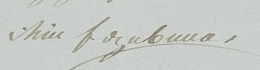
Dein Ergebener
